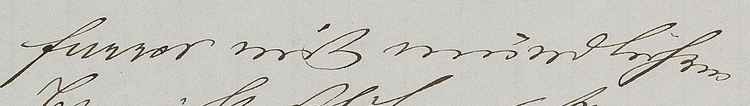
furror mit mündlichem
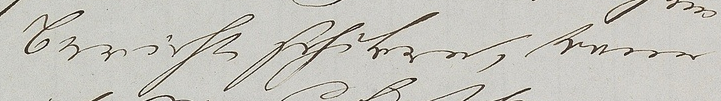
Bericht schiken, wenn
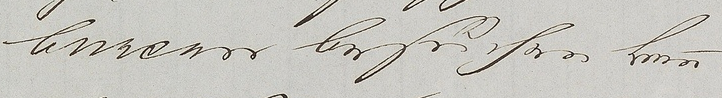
bureau besuchen kann.
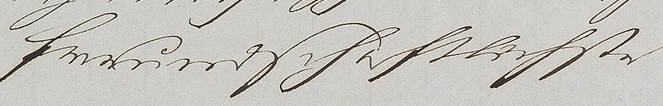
freundschaftlichste
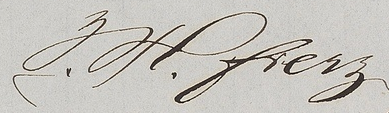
J. H. Fierz
